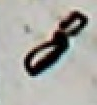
8
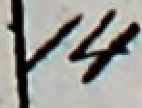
14
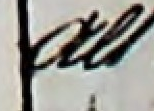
Alt
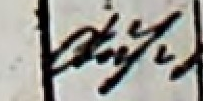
Aus„
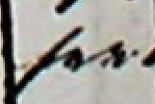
see
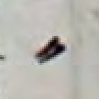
„
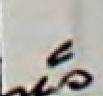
„
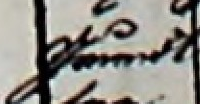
Grundt
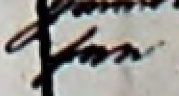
see
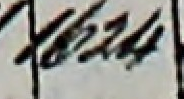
1624
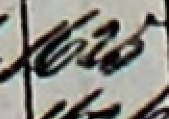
1625
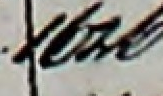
1626
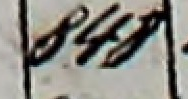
848
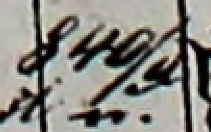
840/a
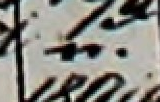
u.
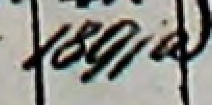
189/a
